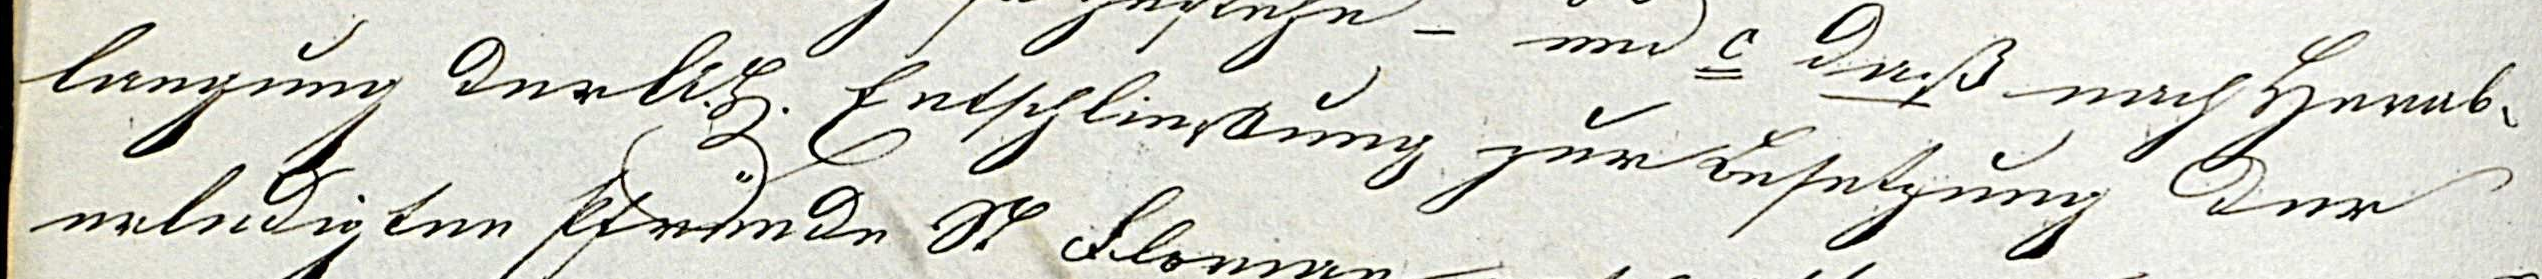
Der Krakauer Diögese zustehe - und c daß nach Heras¬
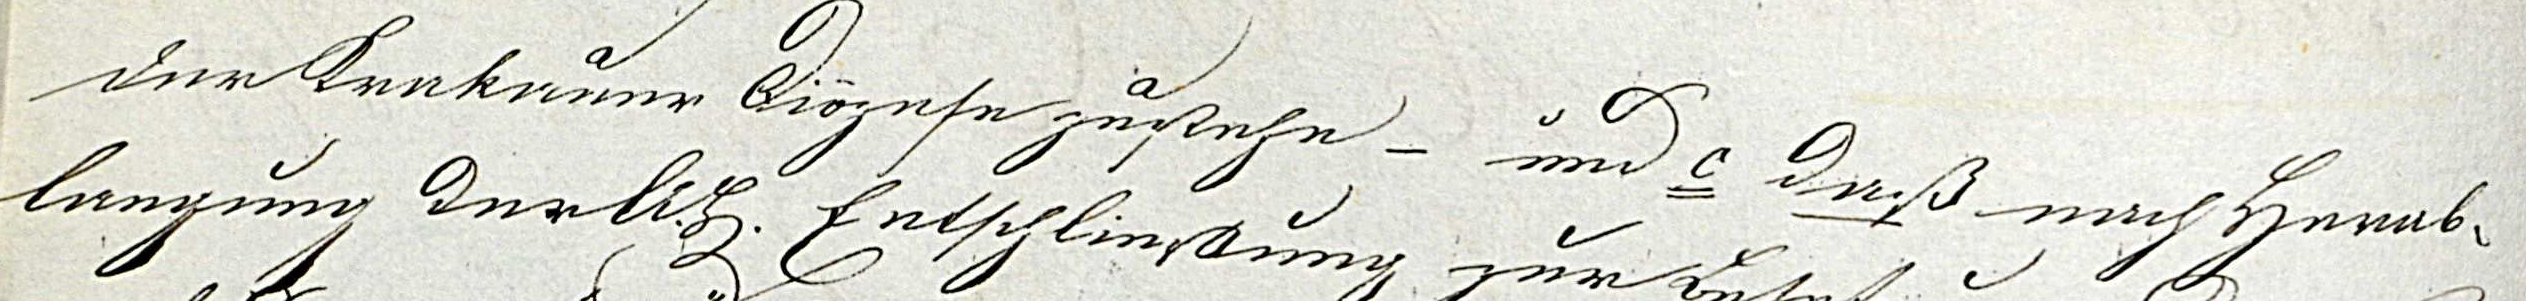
langung der A. H. Entschließung zur Besetzung der
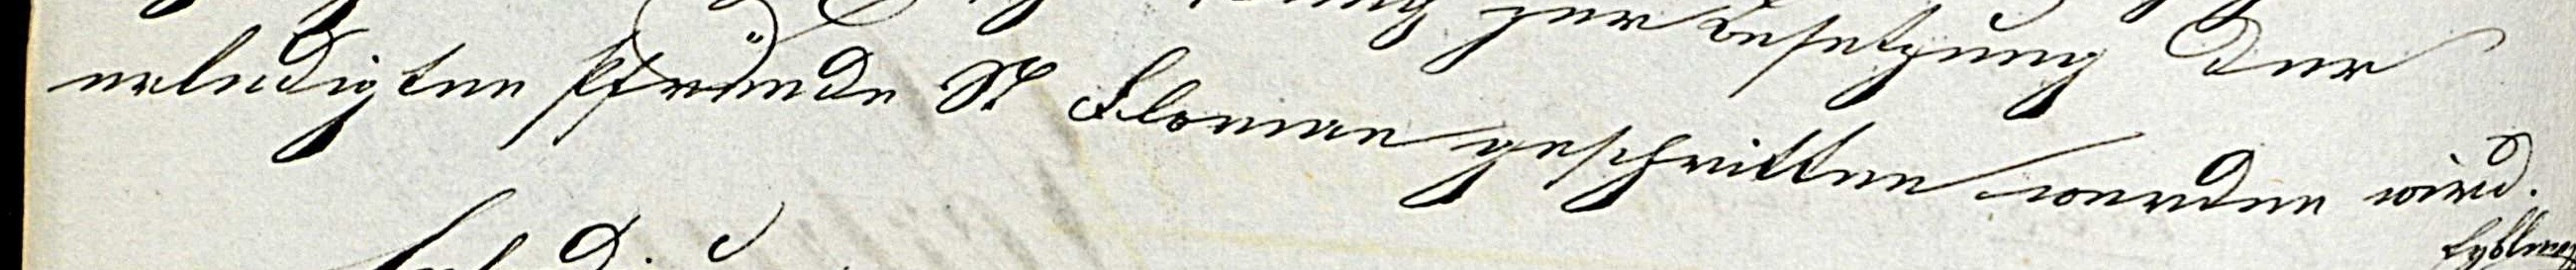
erledigten Pfrunde St Floman geschritten werden wird.
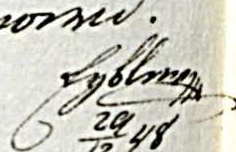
Egblxxx
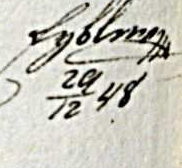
29/12 48
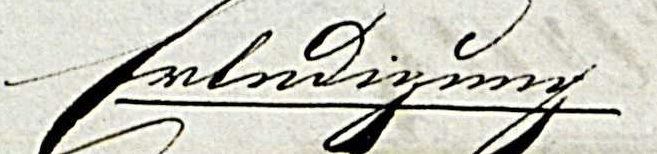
Erledigung
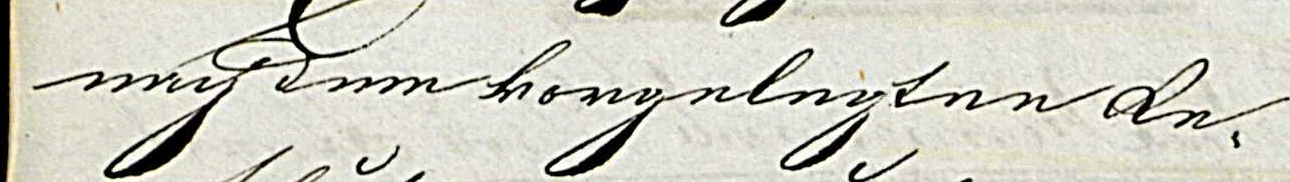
nach dem Borgelegten Le.
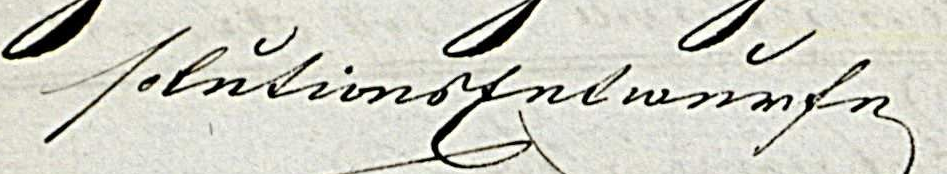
solutionsentwurfe
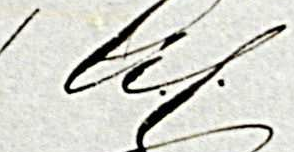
A.E.
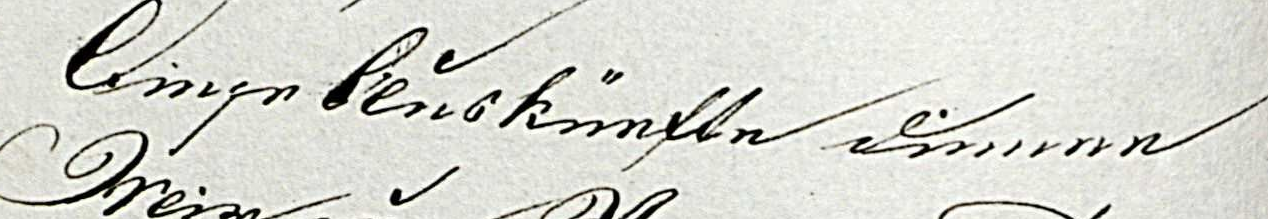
Diese Auskünfte diene
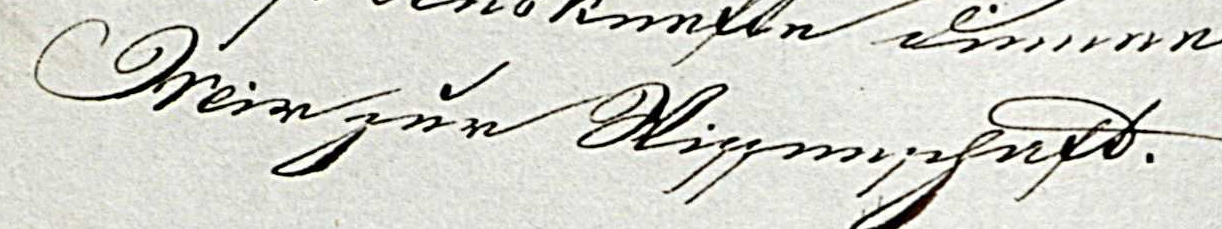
Mir zur Wissenschaft.
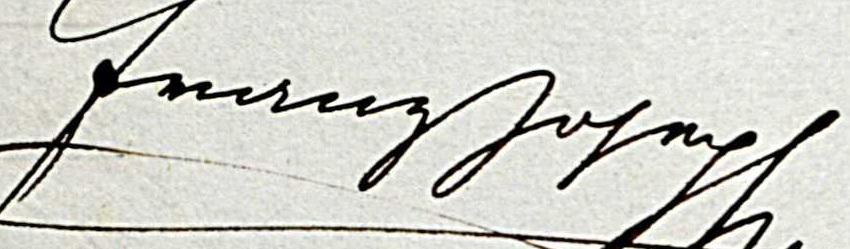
Franz Joseph
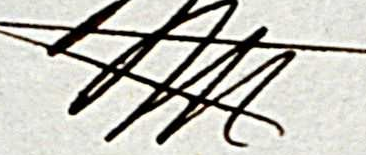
xx
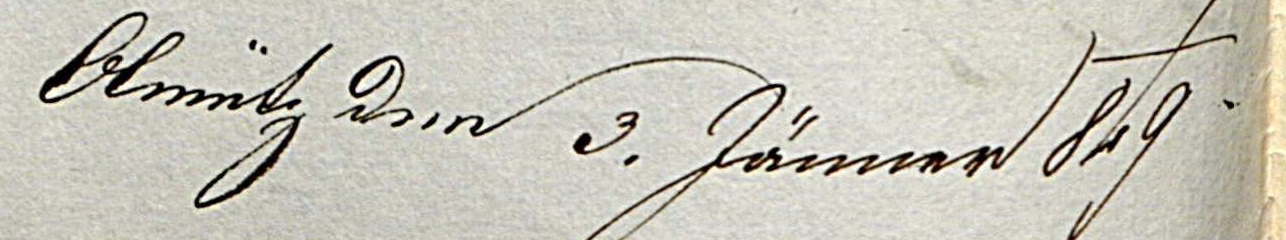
Olmütz den 3. Jänner 849.
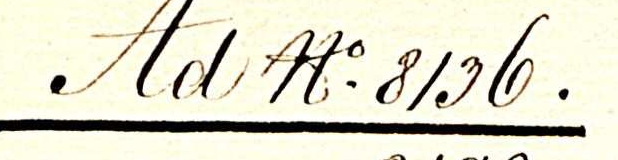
Ad No. 8136.
